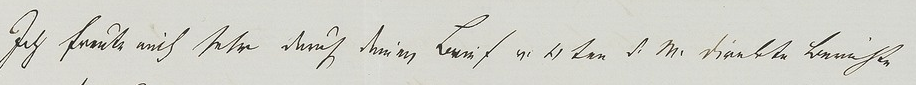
Ich freute mich sehr durch deinen Brief v. 4ten d. M. direkte Berichte
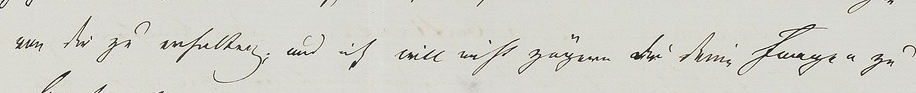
von dir zu erhalten; und ich will nicht zögern dir deine Fragen zu
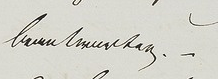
beantworten. –
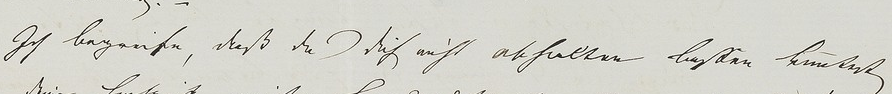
Ich begreife, daß du dich nicht abhalten laßen konntest
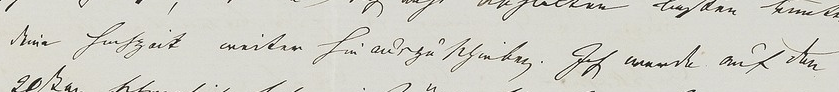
deine Hochzeit weiter hinauszuschieben. Ich werde auf den
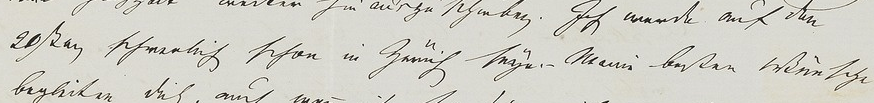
20sten schwerlich schon in Zürich seyn. – Meine besten Wünsche
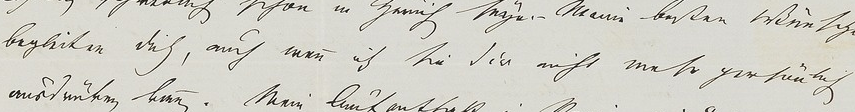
begleiten dich, auch wenn ich sie dir nicht mehr persönlich
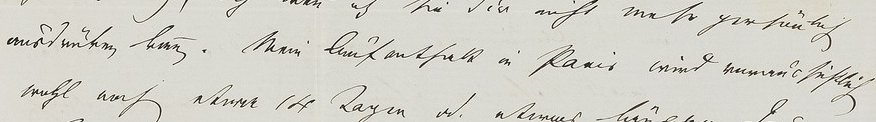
ausdrüken kann. Mein Aufenthalt in Paris wird voraussichtlich
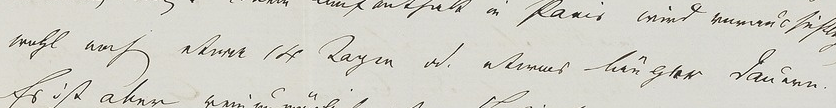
wohl noch etwa 14 Tagen od. etwas länger dauern.
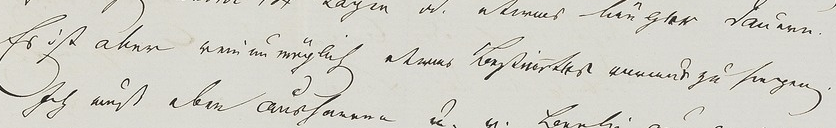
Es ist aber rein unmöglich etwas Bestimmtes voraus zu sagen.
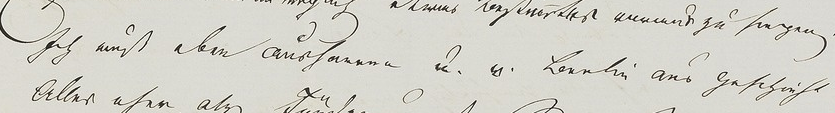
Ich muß eben ausharren u. v. Berlin aus geschieht
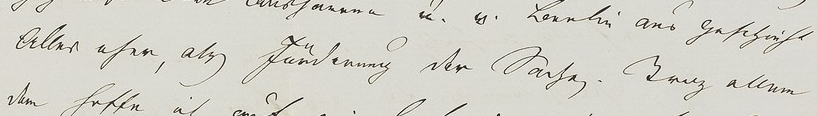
Alles eher, als Förderung der Sache. Troz allem
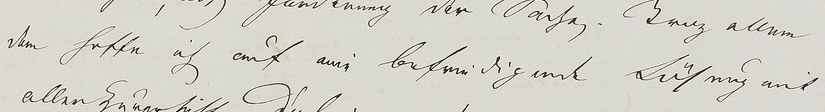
dem hoffe ich auf eine befriedigende Lösung mit
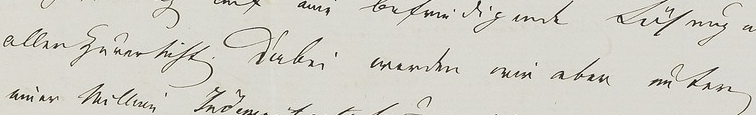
aller Zuversicht. Dabei werden wir aber unter
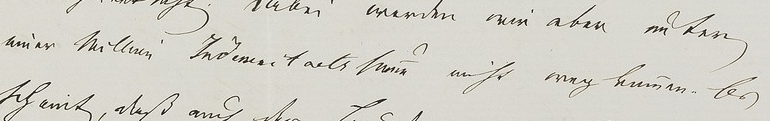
einer Million Indemnitaetssumme nicht weg kommen. Es
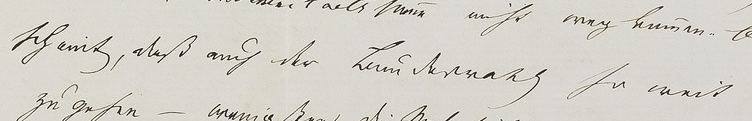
scheint, daß auch der Bundesrath so weit
